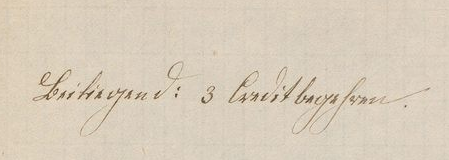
Beiliegend: 3 Creditbegehren.
